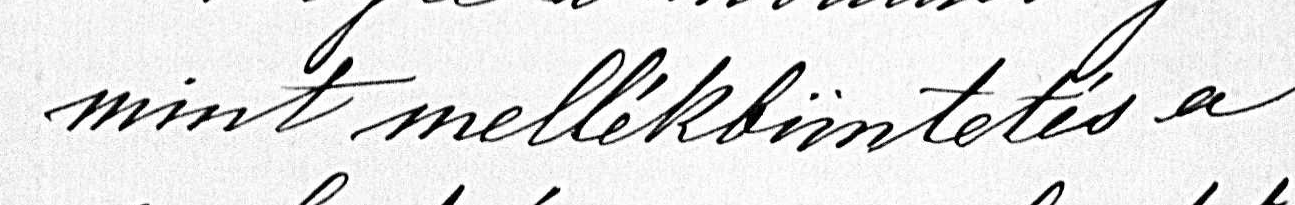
mint mellékbimtetés a
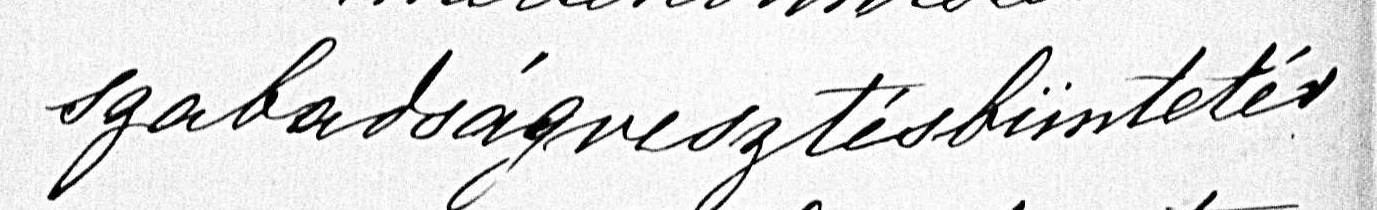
sgabadságvesztésbimtetér
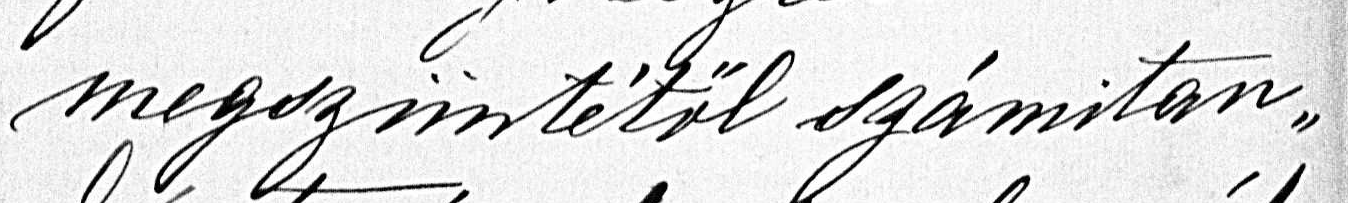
geszimtétöl számitan¬
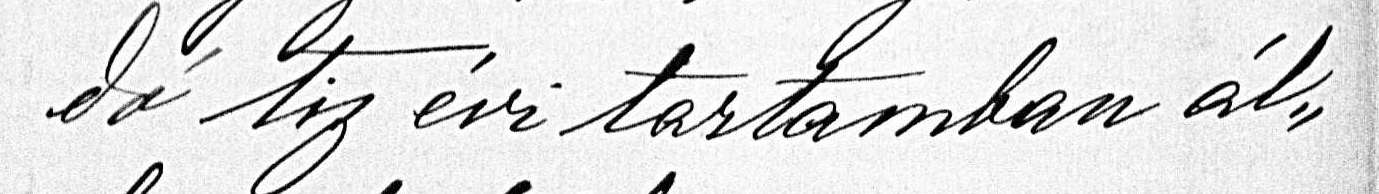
do tiz evi tartamban ál¬
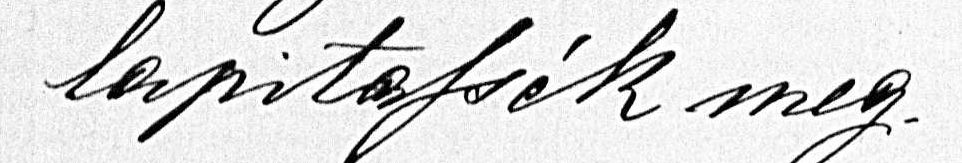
lapitahsék meg.
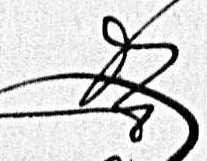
FJ
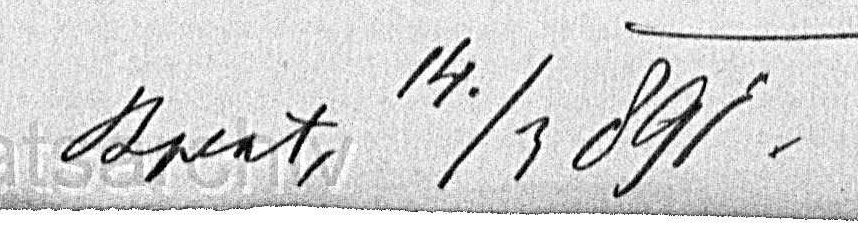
Bpest 14/3 1891
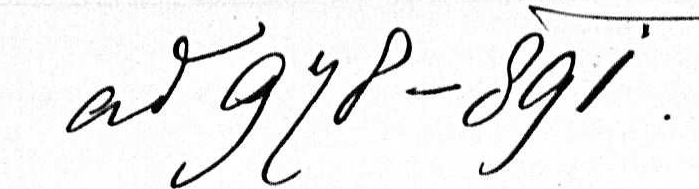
ad 978 – 1891
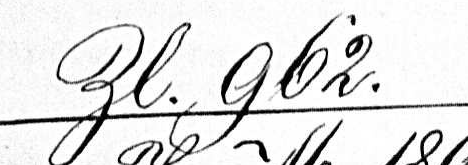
Zl 962
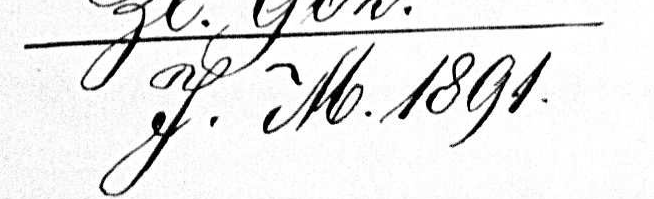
J. M. 1891
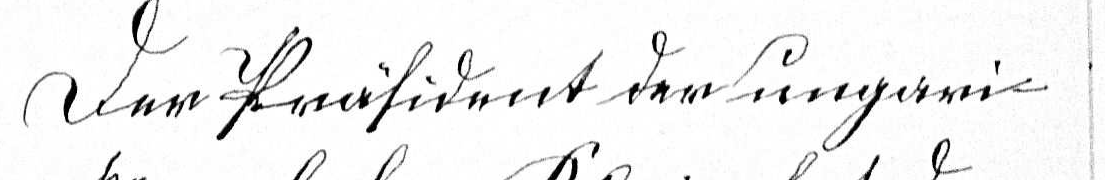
Der Präsident der ungari¬
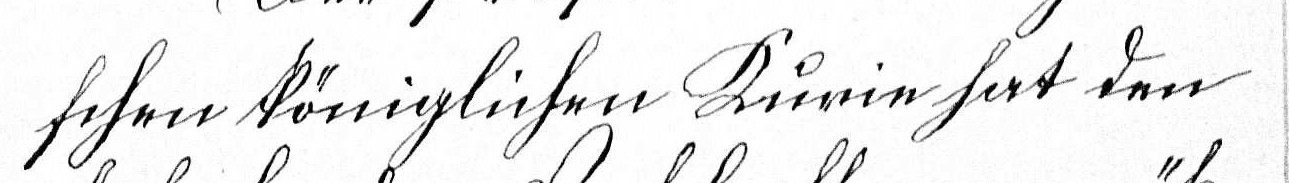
schen königlichen Kurie hat den
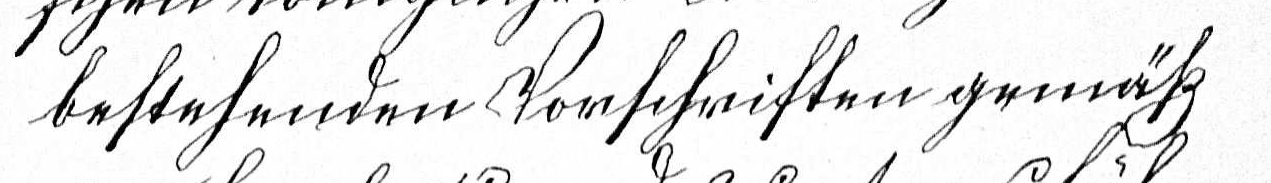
bestehenden Vorschriften gemäß
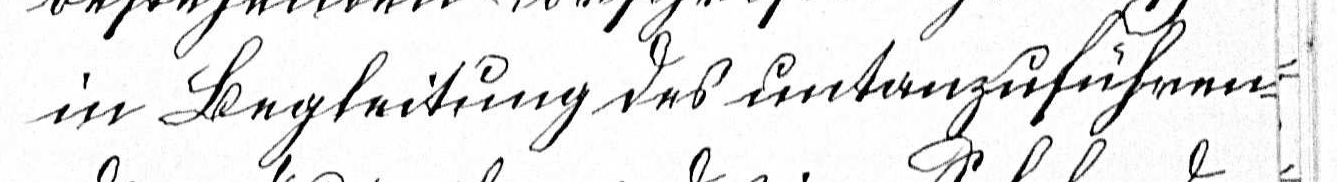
in Begleitung des untanzuführen¬
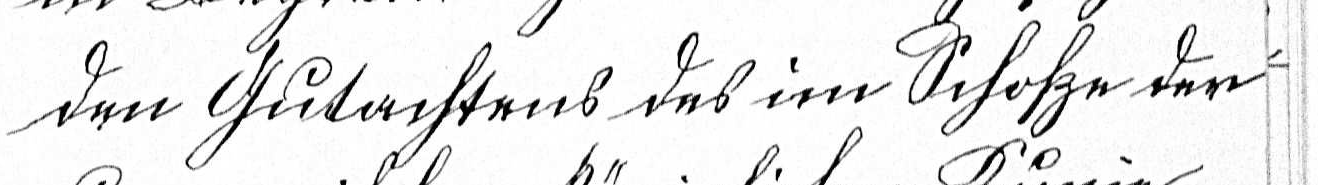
den Gutachtens des im Schloße der
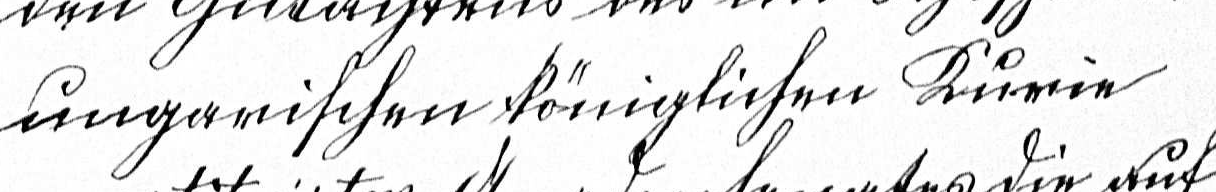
ungarischen königlichen Kurie
